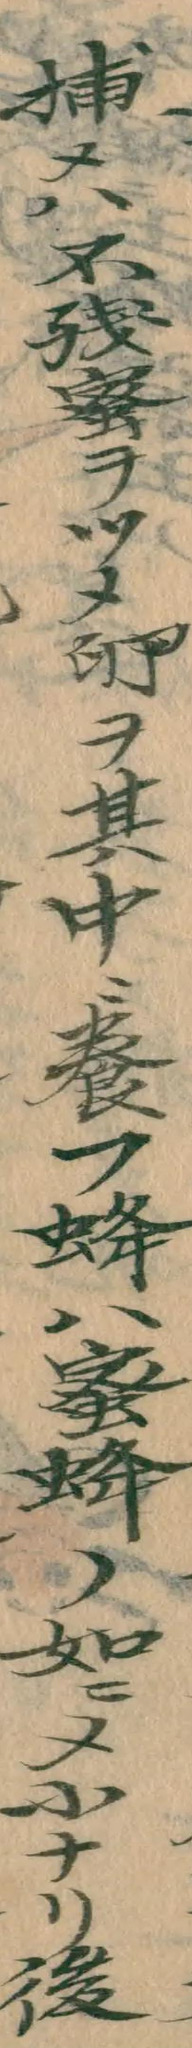捕メハ不残蜜ヲツメ卵ヲ其中ニ養フ蜂ハ蜜蜂ノ如ニシテ小ナリ後
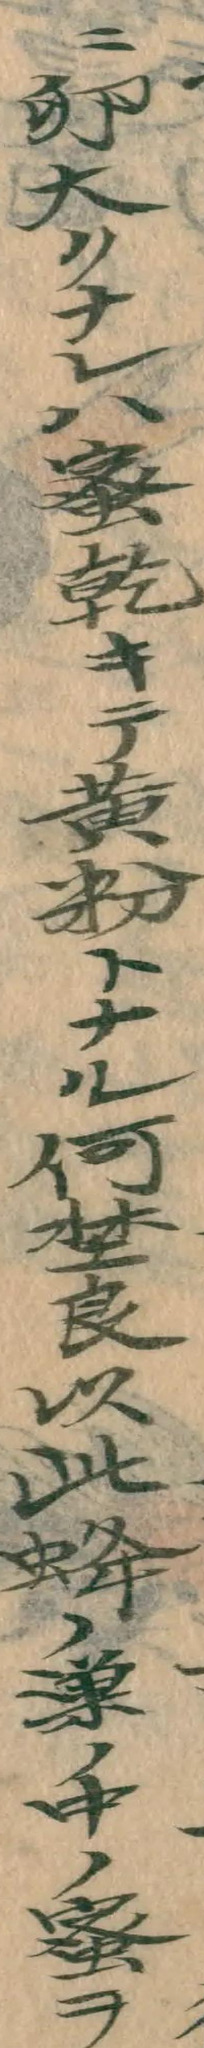ニ卵大クナレハ蜜乾キテ黄粉トナル何埜良以此蜂ノ巣ノ中ノ蜜ヲ
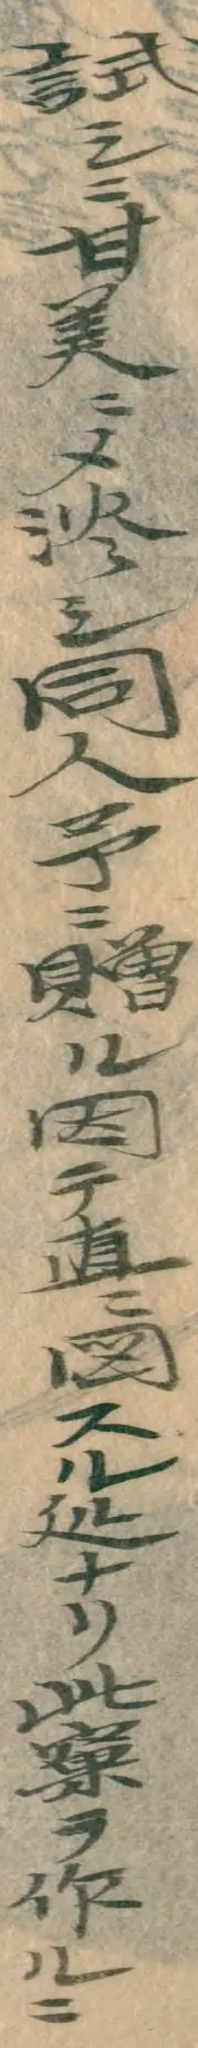試シニ甘美ニシテ淡シ同人予ニ贈ル因テ直ニ図スル処ナリ此窼ヲ作ルニ
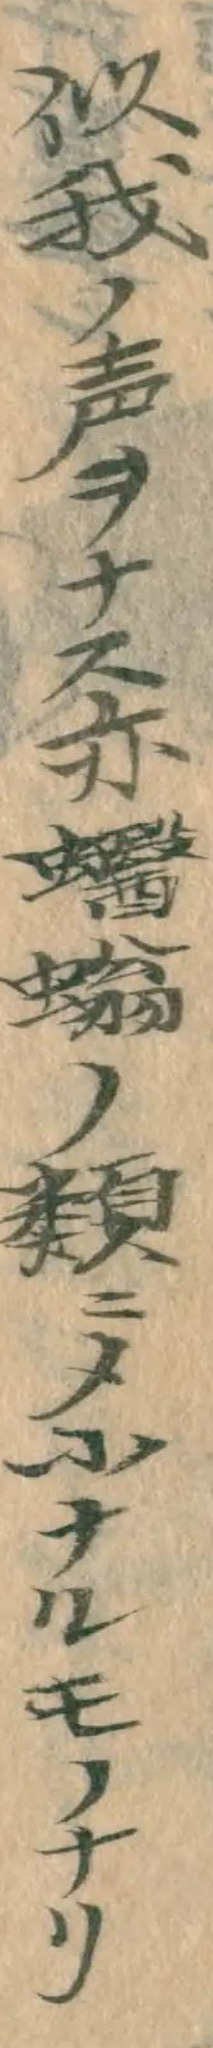似我ノ声ヲナス亦螉ノ類ニシテ小ナルモノナリ

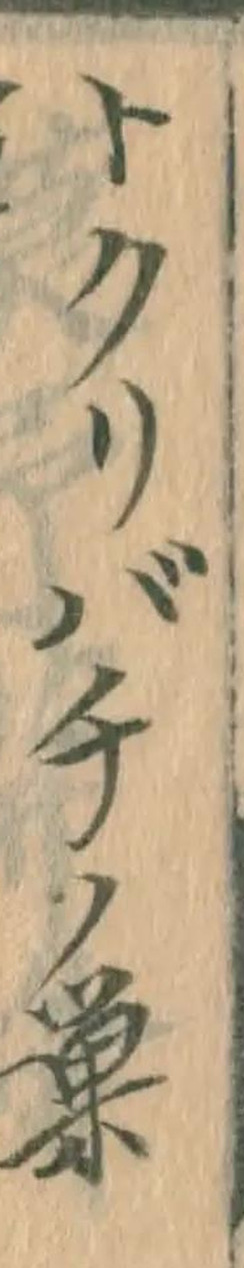トクリバチノ巣
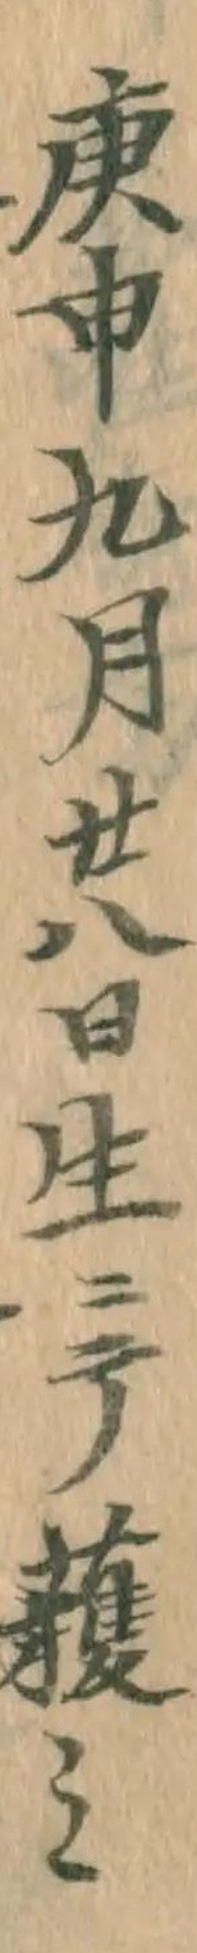庚申九月廿八日生ニテ獲ミ
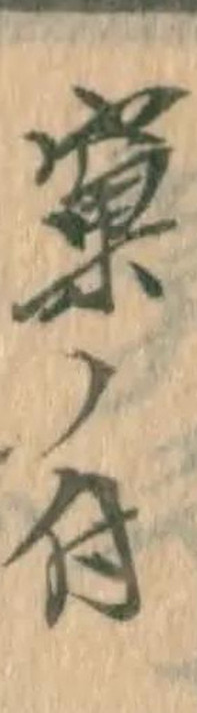窠ノ付
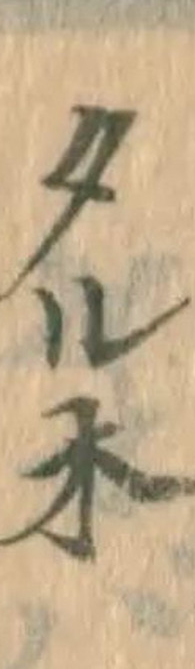タル木
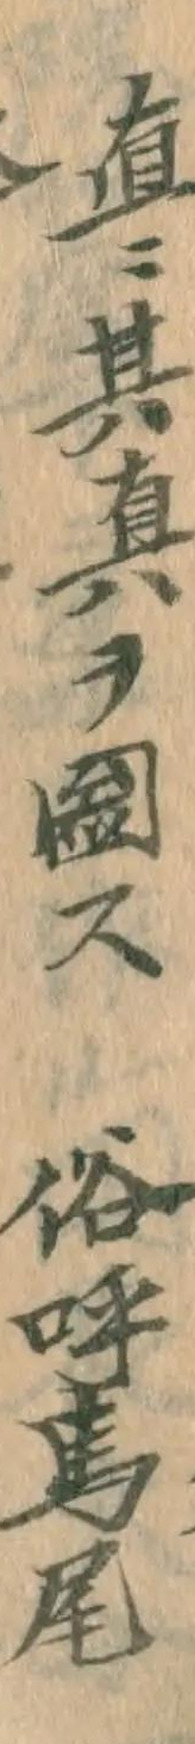直ニ其真ヲ圖ス俗呼馬尾
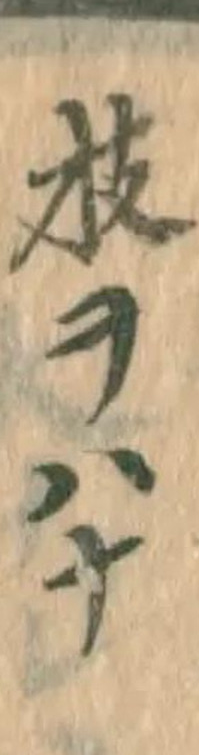枝ヲハナ
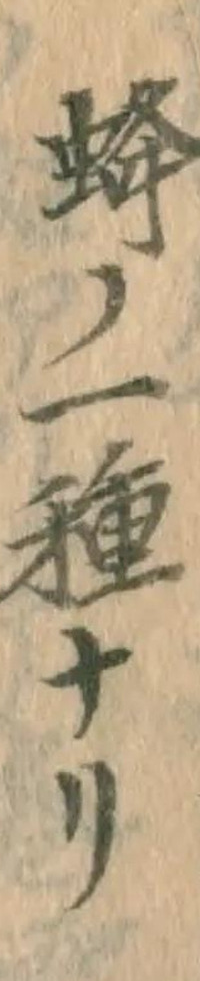蜂ノ一種ナリ
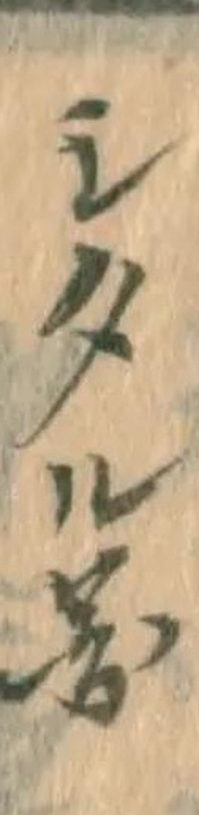シタル圖
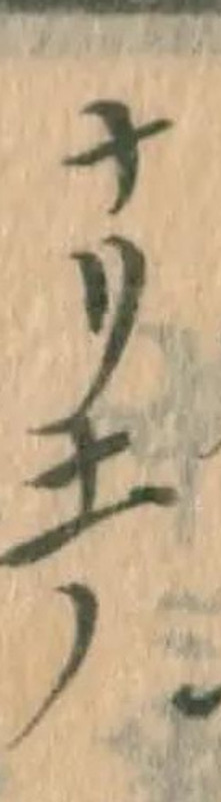ナリ土ノ
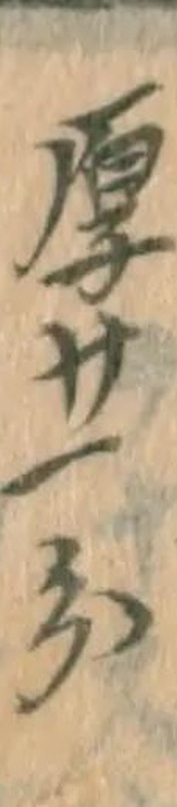厚サ一分
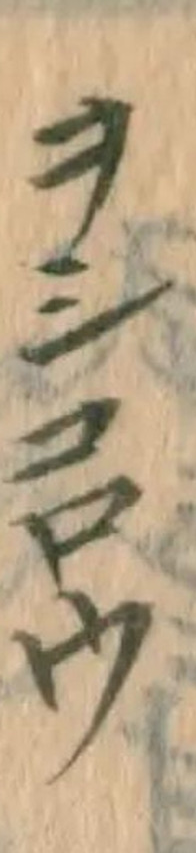ヲシコロウ
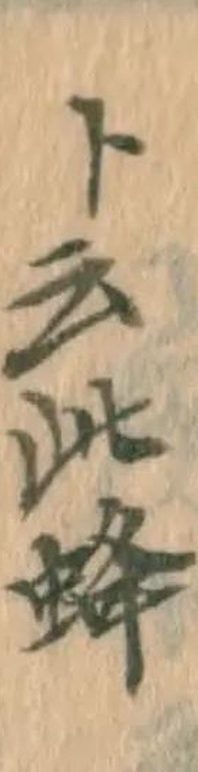ト云此蜂
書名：千蟲譜 3巻. [2]
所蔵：国立国会図書館 National Diet Library, JAPAN
